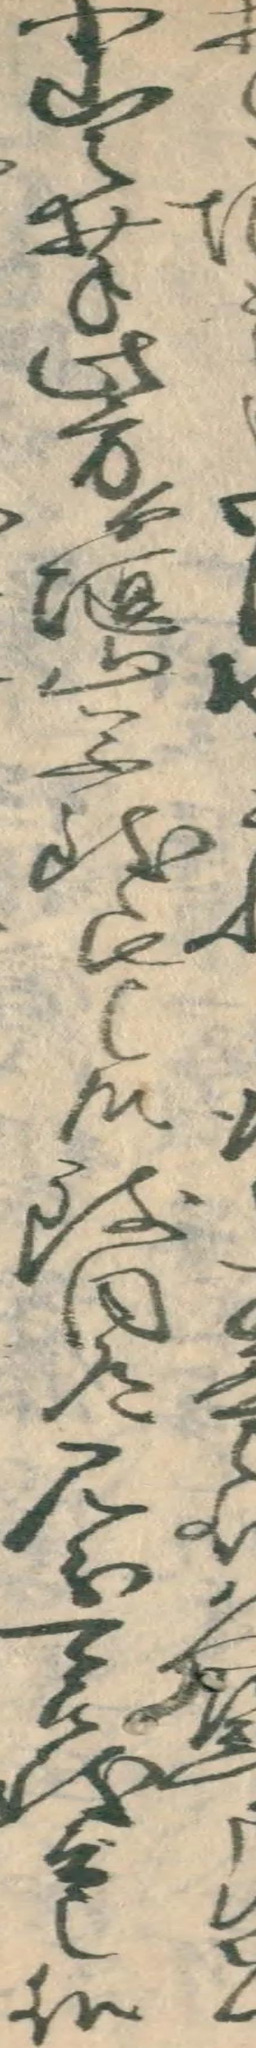小山之井手此方ゟ堰止ハ不致候由申候故致同道見分可被致旨申候処
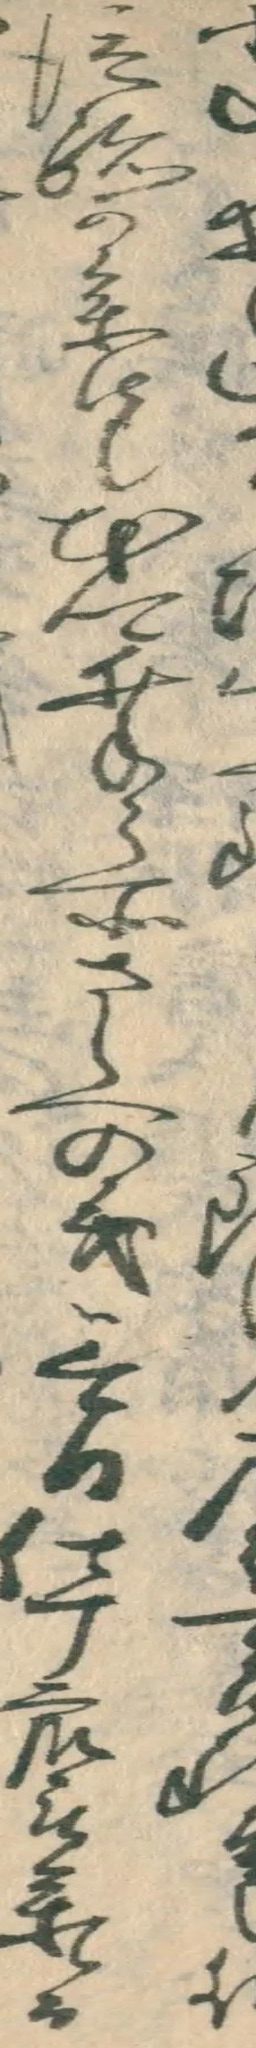従跡可参由申候本郷井手之所さらへの義ハ今日仕丁衆被参候而
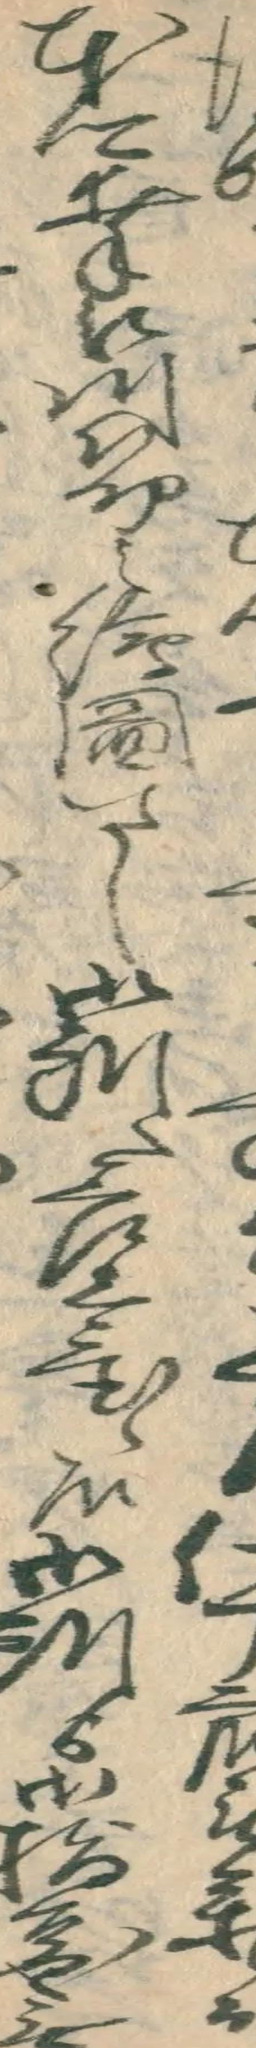本郷井手口川筋之絵図いたし御所へ差上置候故御所ゟ御指図無
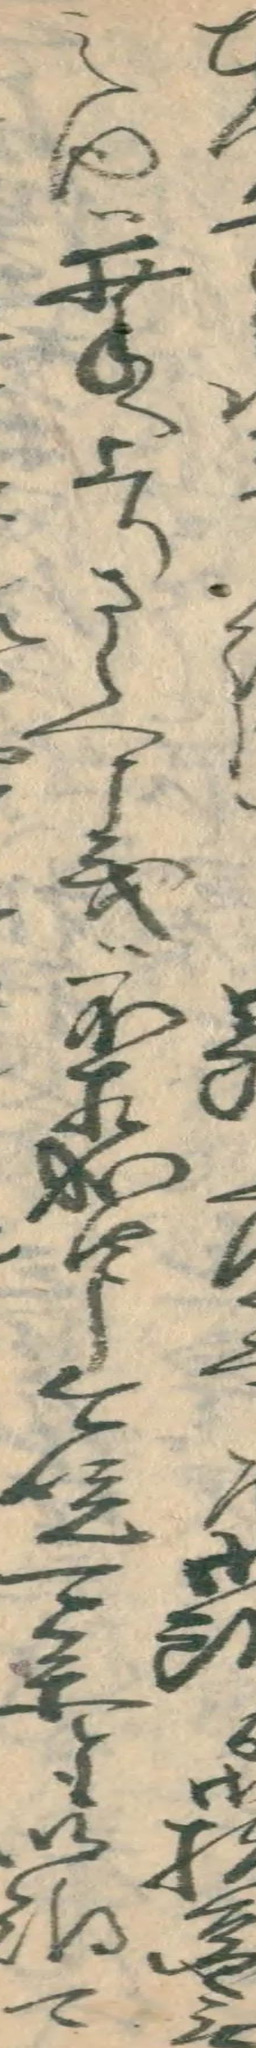之内ハ井手へ上りさらへ申義ハ不相成由申候今晩可参とも明朝可
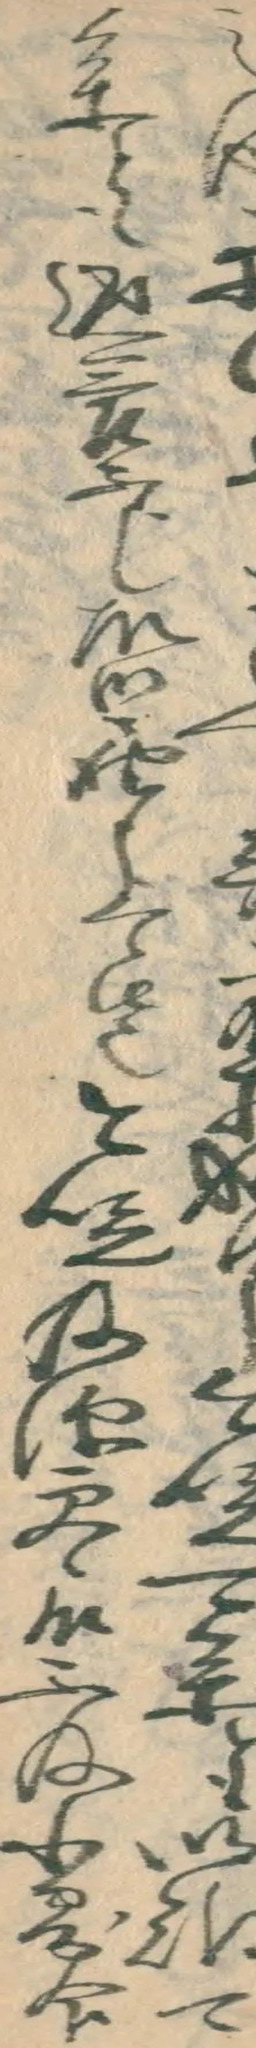参とも返答不申候故御届申上候由也今晩及深更候故不及小寄合

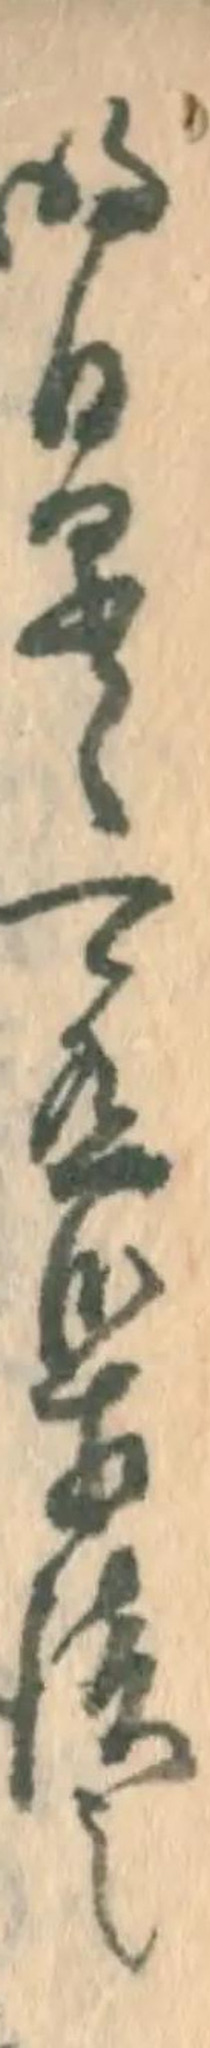明日早々可有御相談也
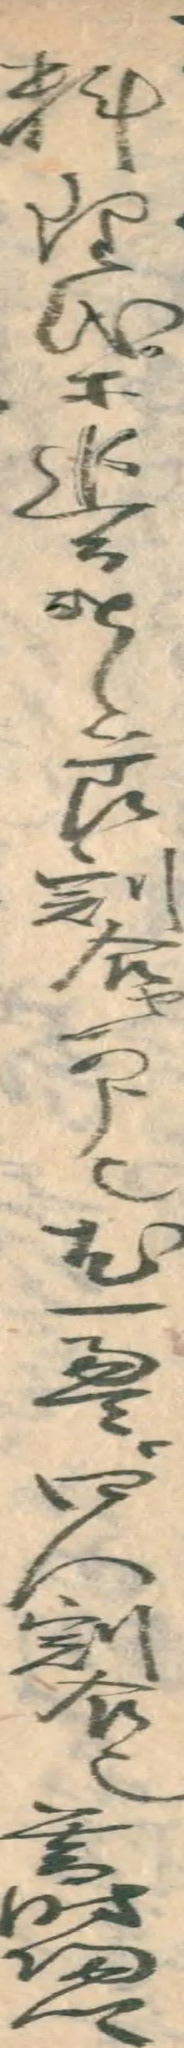料理代等追而遣候節割合セ可申也尤一畳ニ四人割合也暮時帰郷
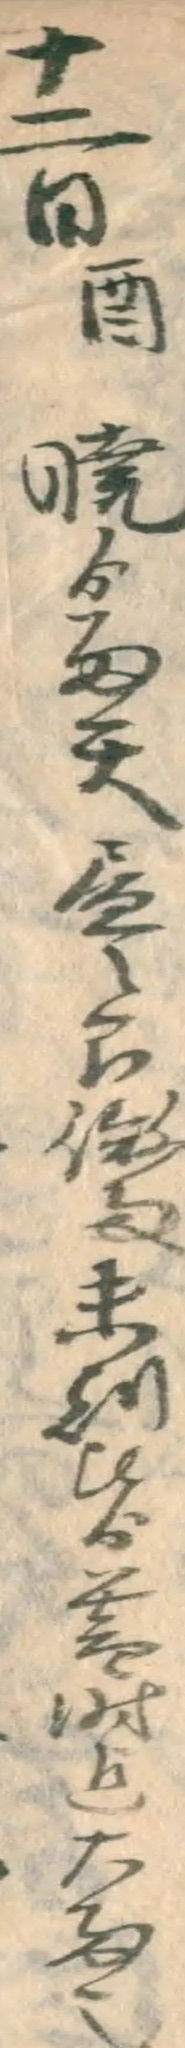十二日酉暁ゟ雨天昼之間微雨未刻比ゟ暮時迄大雨也
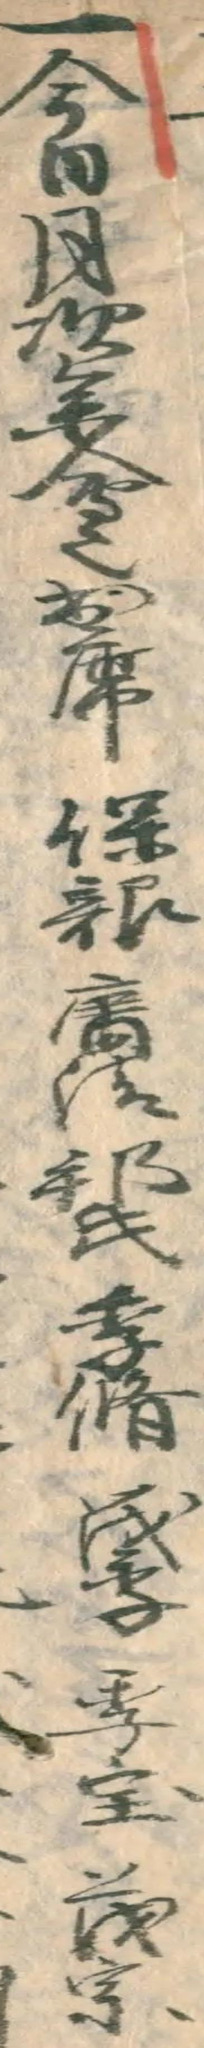一今日月次参会也出席保韶庸清邦氏季脩茂季季宝茂宗
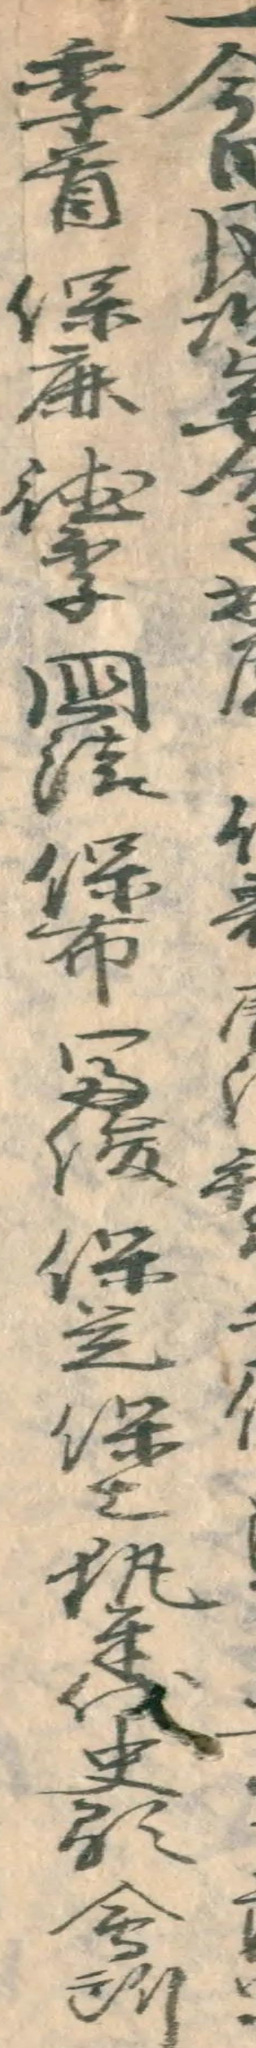季首保鹿徳季国清保布富俊保覚保土執筆代史顕会所
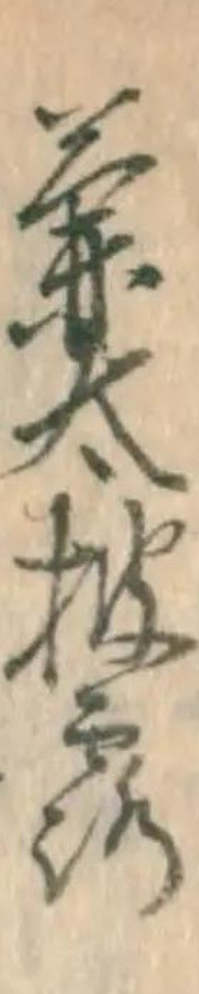兼太披露
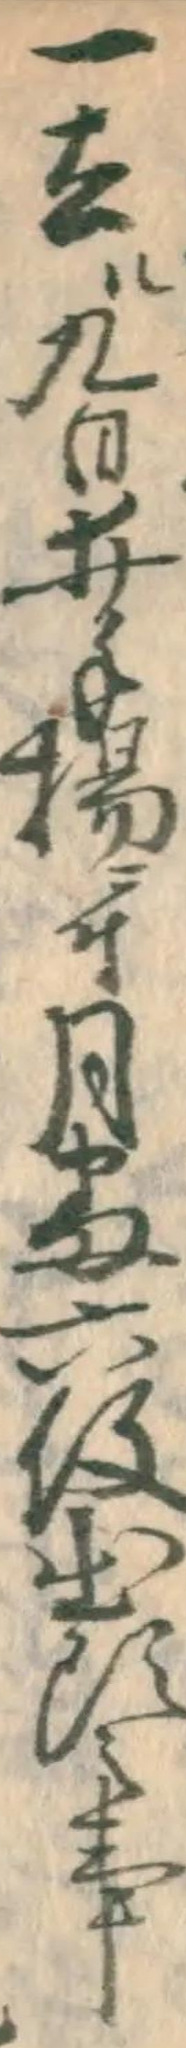一去ル九日井手揚ニ付月番六役出頭之事
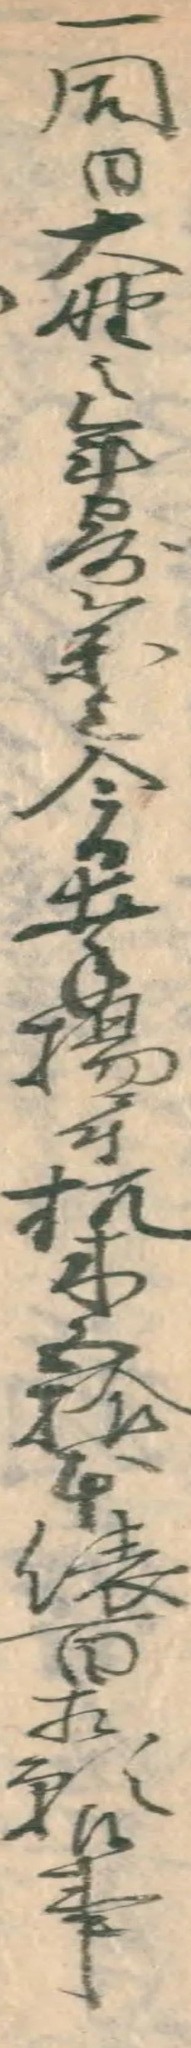一同日大野之年寄参上今日井手揚ニ付杭木五拾本俵百相願候事
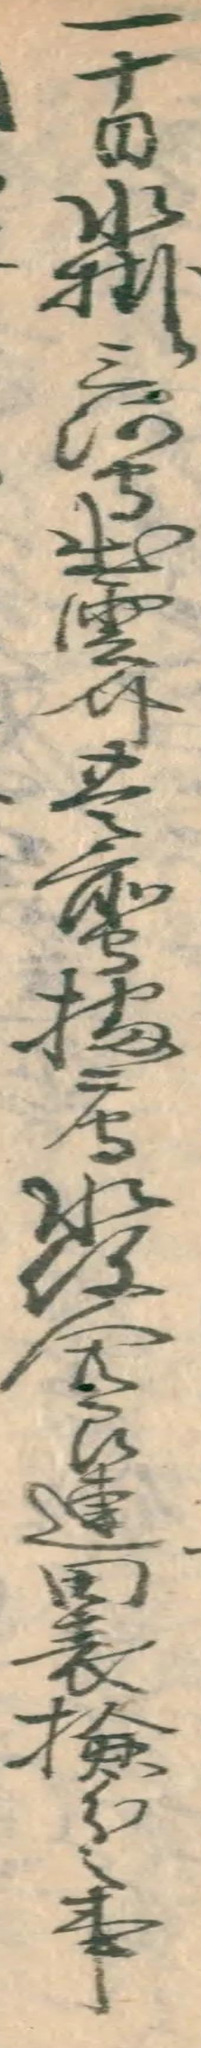一十日水掛り三河守出雲介豊前守播磨守水役人共召連田表検分之事
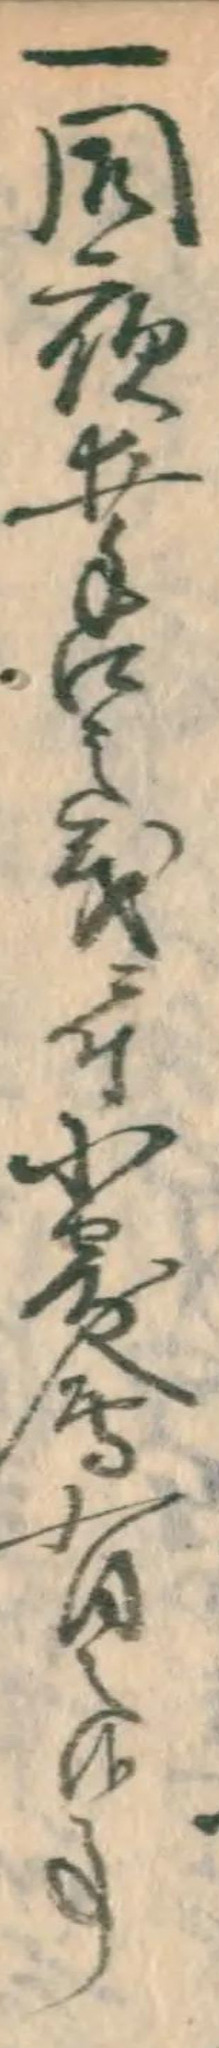一同夜井手口之義ニ付小寄会有之候事
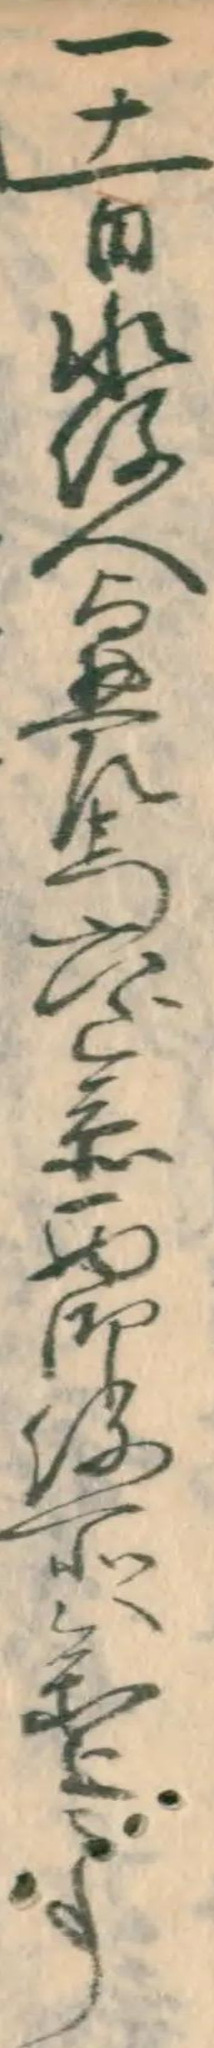一十一日水役人与惣左衛門六郎兵衛西御役所へ参上之事
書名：賀茂社記録. 第58冊
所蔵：国立国会図書館 National Diet Library, JAPAN
